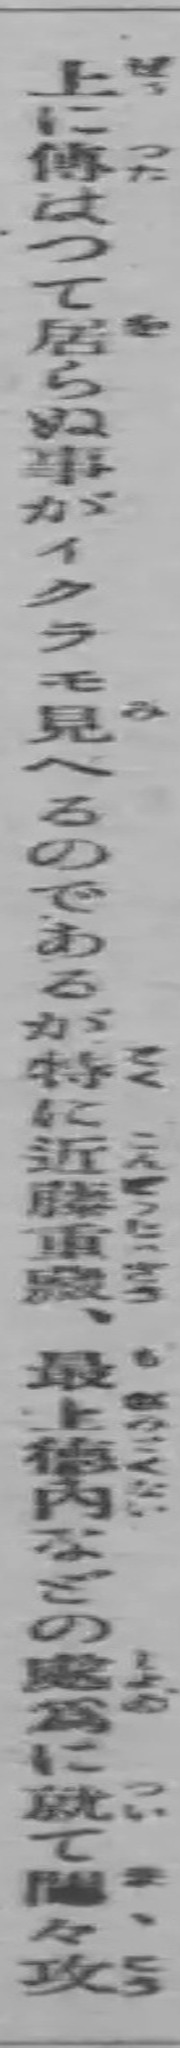上に伝はつて居らぬこと事がイクラモ見へるのであるが特に近藤重蔵、最上徳内などの処為に就て間々攻
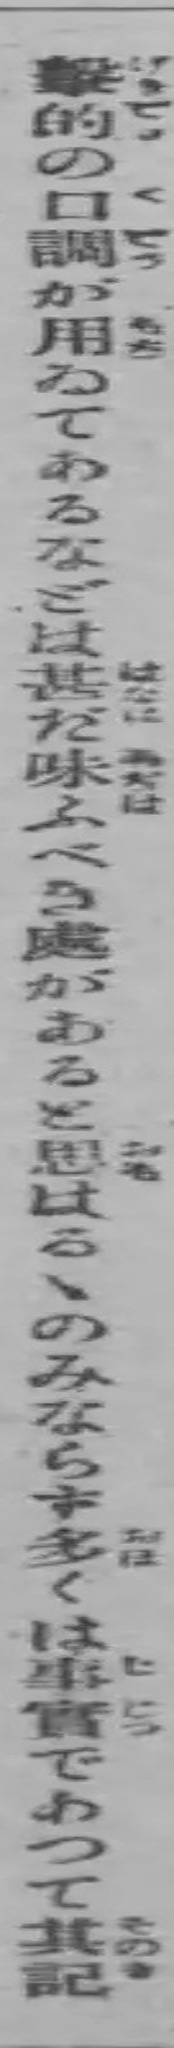撃的の口調が用ゐてあるなどは甚だ味ふべき処があると思はるゝのみならず多くは事実であつて其記
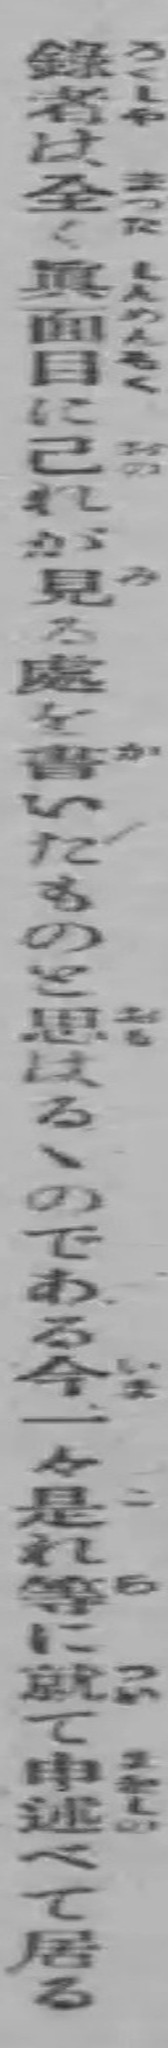録者は全く眞面目に己れが見る処を書いたものと思はるゝのである今一々是れ等に就て申述べて居る
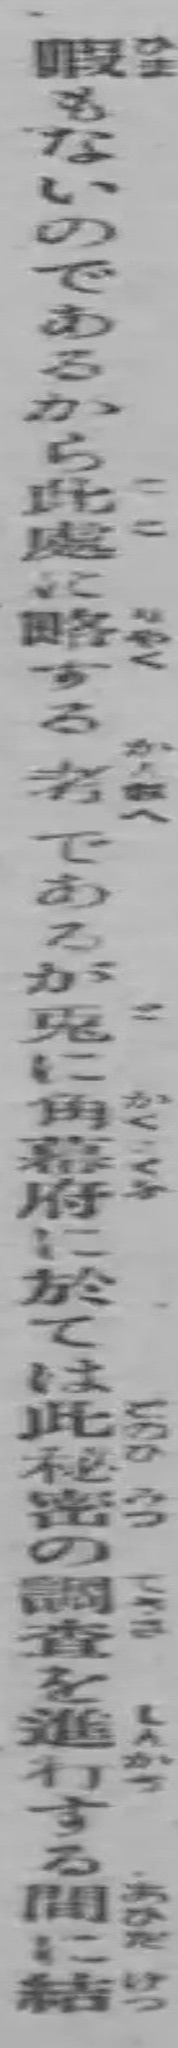暇もないのであるから此処に略する考であるが兎に角幕府に於いては此秘密の調査を進行する間に結
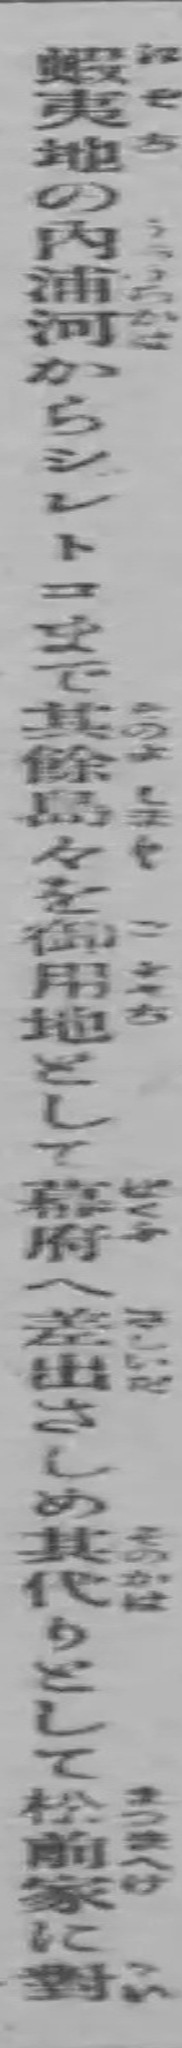蝦夷地の内浦河からシレトコまで其余島々を御用地として幕府へ差出さしめ其代りとして松前家に対
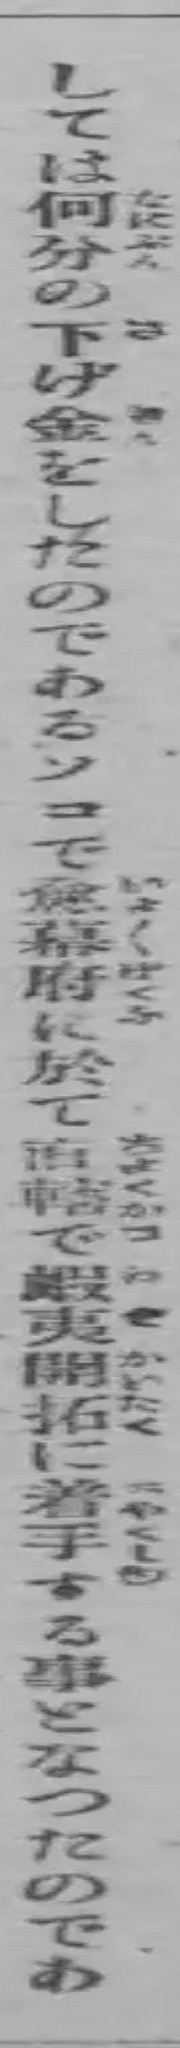しては何分の下げ金をしたのであるソコで愈々幕府に於て直轄で蝦夷開拓に着手する事となつたのであ
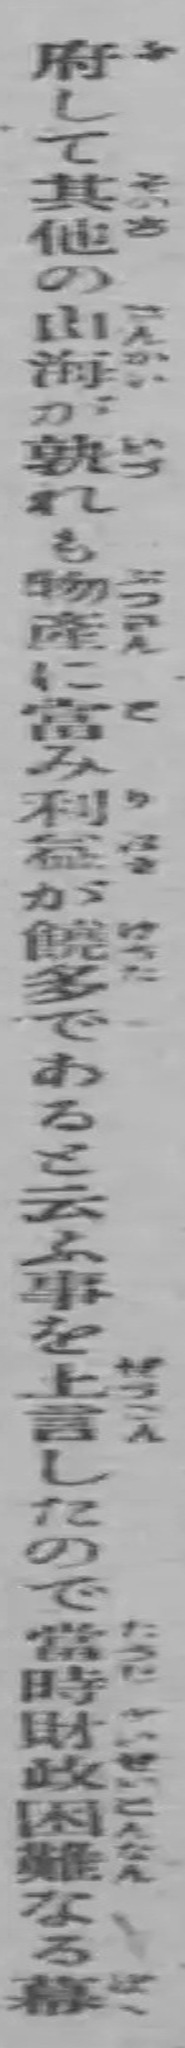府して其地の山海が孰れも物産に富み利益が饒多であると云ふ事を上言したので当時財政困難なる幕
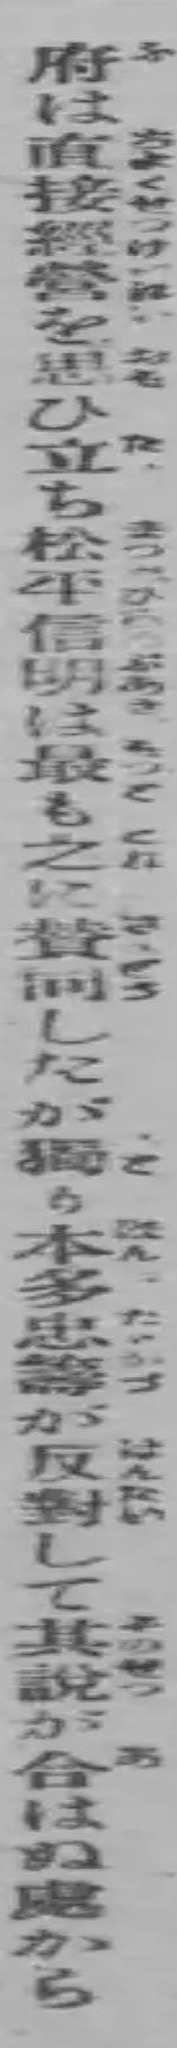府は直接経営を思ひ立ち松平信明は最も之に賛同したが独り本多忠籌が反対して其説が合はぬ処から
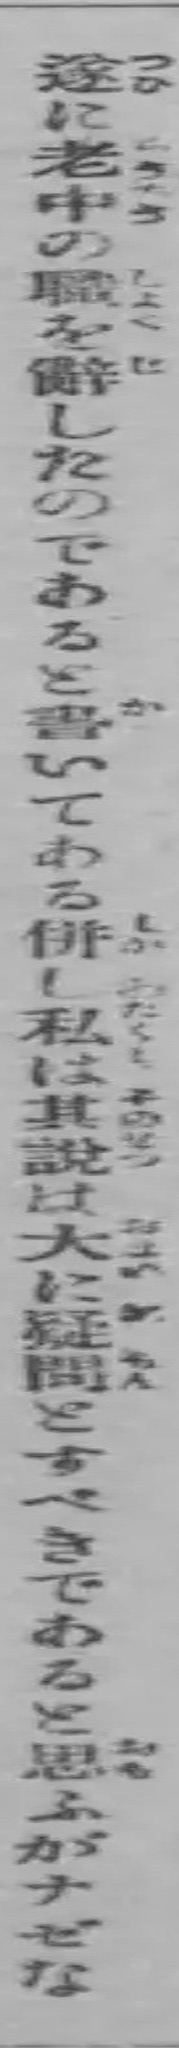遂に老中の職を辞したのであると書いてある併し私は其説は大に疑問とすべきであると思ふがナゼな
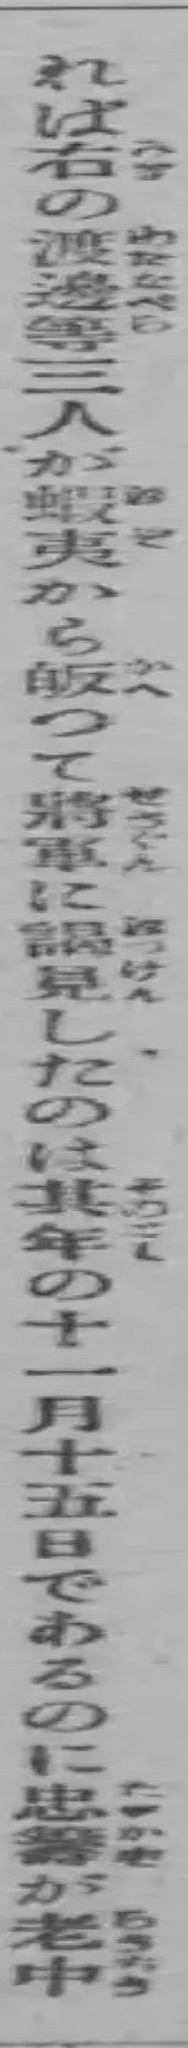れば右の渡邊等三人が蝦夷から皈つて将軍に謁見したのは其年の十一月十五日であるのに忠籌が老中
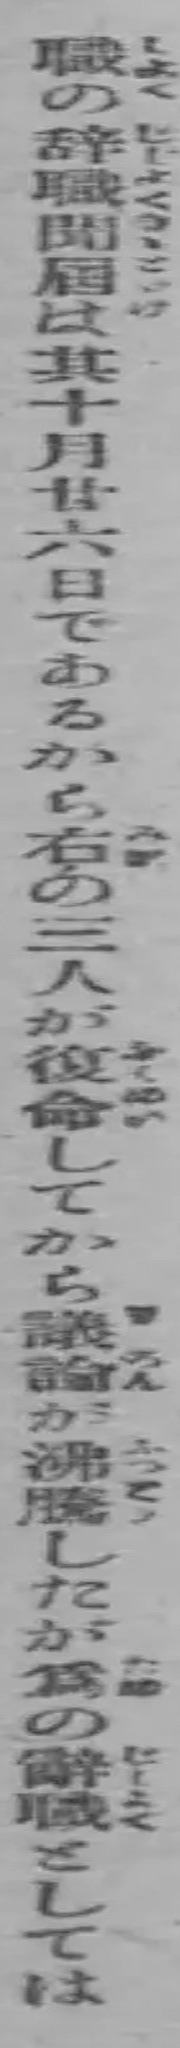職の辞職聞届は其十月廿六日であるから右の三人が復命してから議論が沸騰したが為の辞職としては

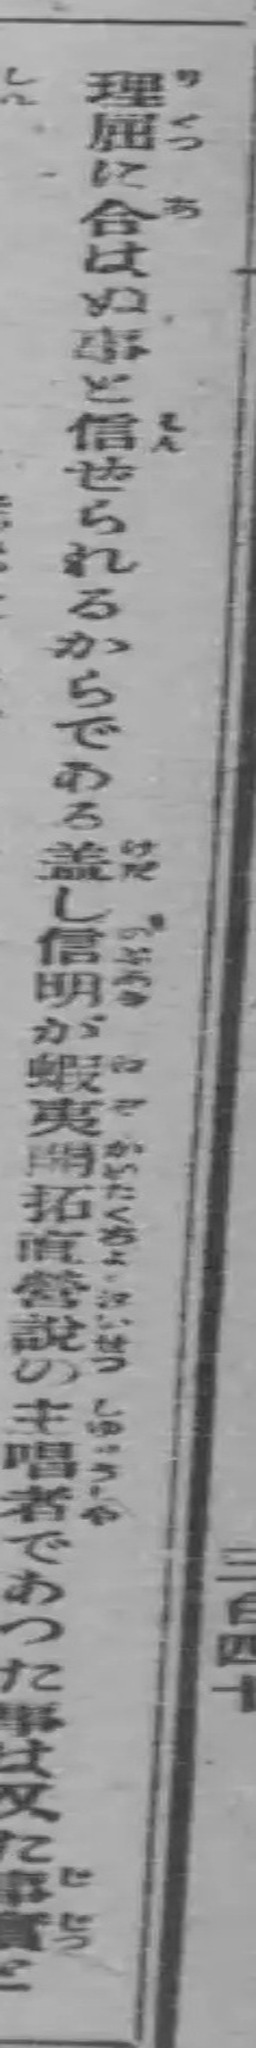理屈に合はぬ事と信ぜられるからである蓋し信明が蝦夷開拓直営説の主唱者であつた事は又た事実と
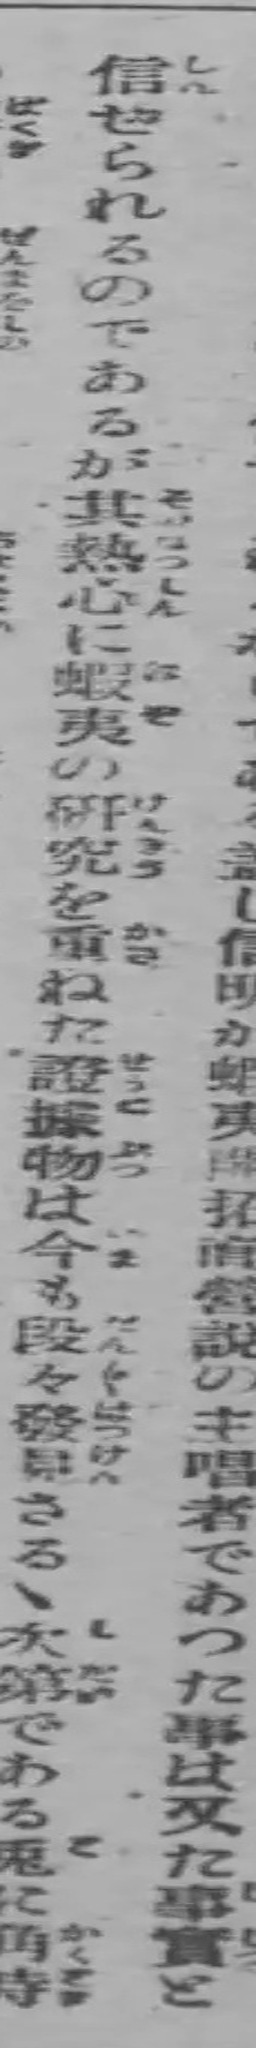信ぜられるのであるが其熱心に蝦夷の研究を重ねた証拠物は今も段々発見さるゝ次第である兎に角時
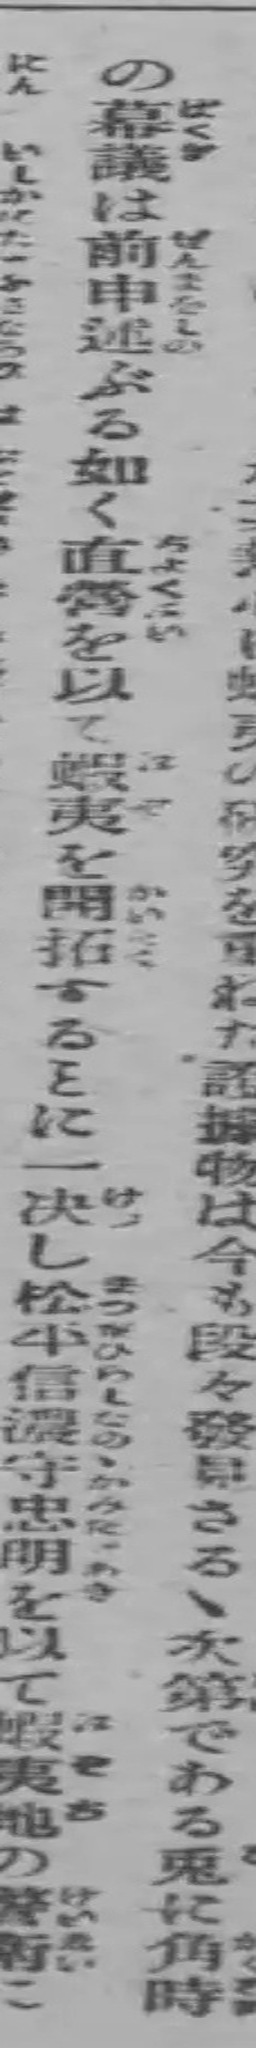松平信濃守の幕議は前申述ぶる如く直営を以て蝦夷を開拓することに一決し松平信濃守忠明を以て蝦夷地の警衛に
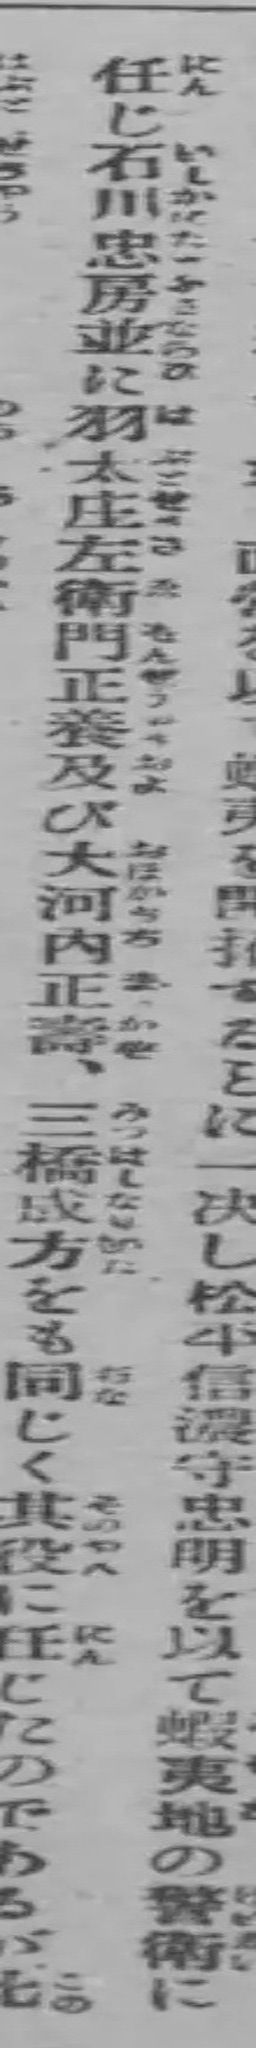任じ石川忠房並に羽太庄左衛門正養及び大河内正壽、三橋成方をも同じく其役に任じたのであるが此
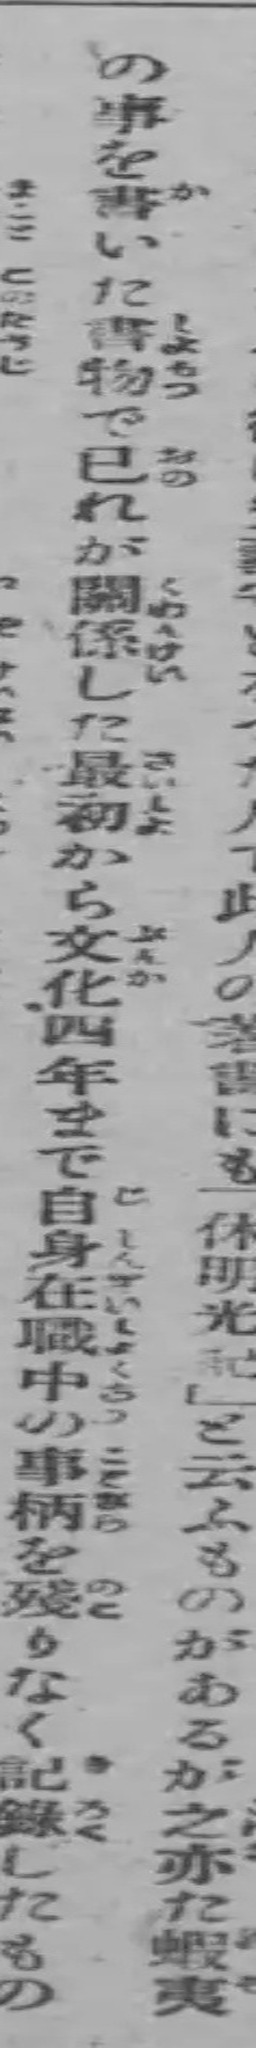の事を書いた書物で己れが関係した最初から文化四年まで自身在職中の事柄を残りなく記録したもの
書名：豊橋市史談
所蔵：国立国会図書館 National Diet Library, JAPAN
